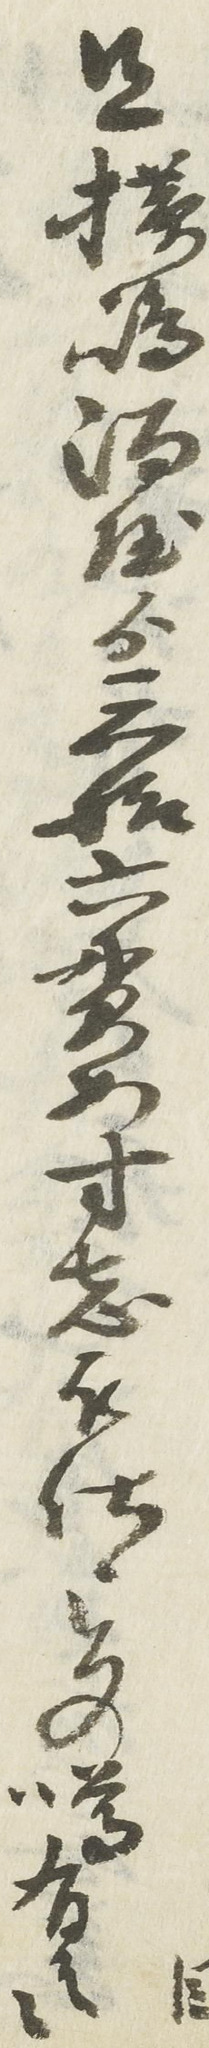且横嶋酒屋ゟ三拾六貫め寸志被仕候との噂有之候
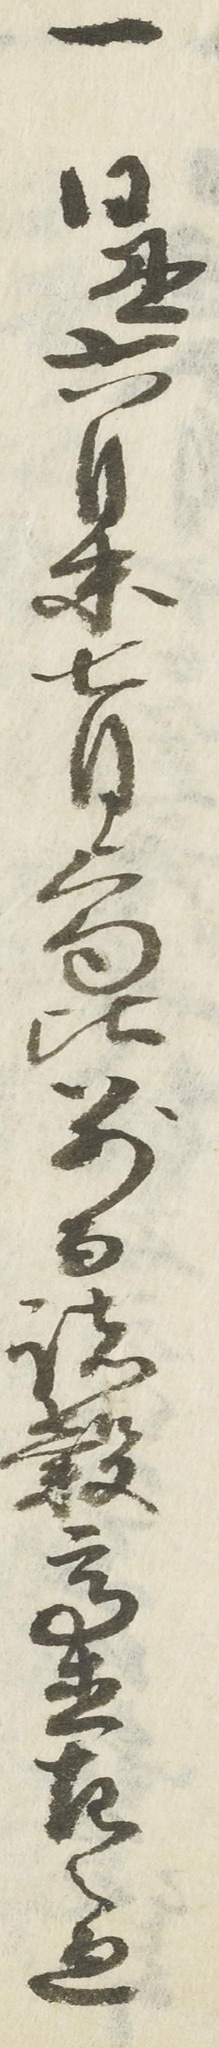一同丑六月末七月上旬比別而諸穀高直左之通
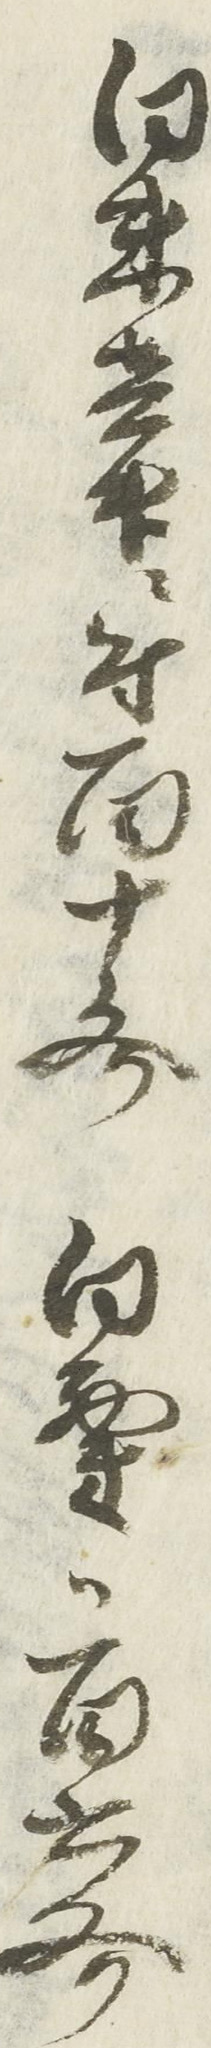白米壱升ニ付百十文白粟〃百六文
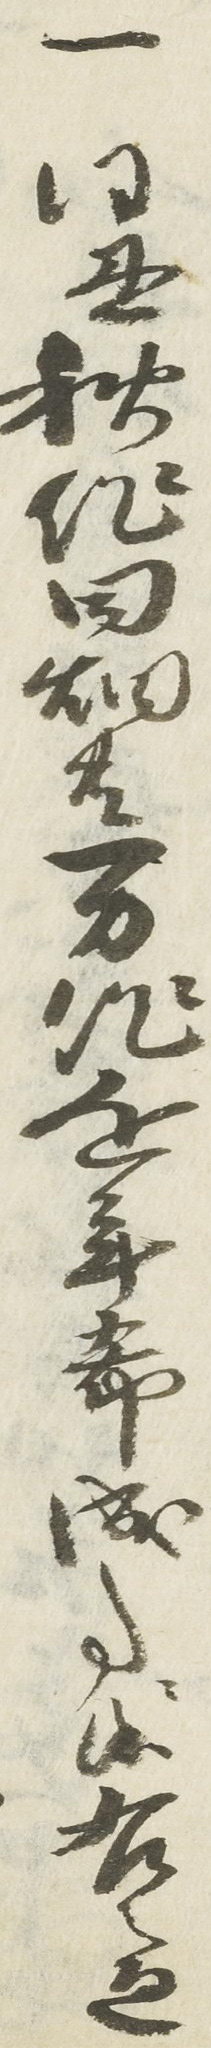一同丑秋作田畑共万作近年希成事ニ候左之通
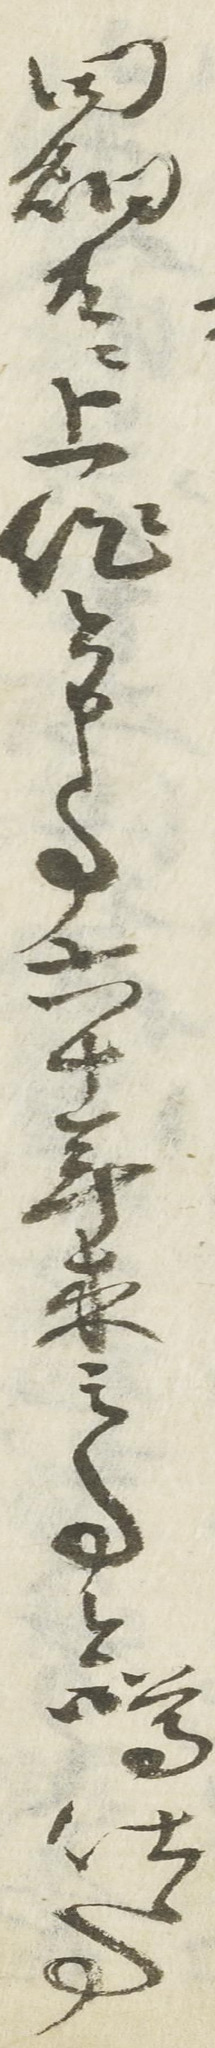田畑共ニ上作と申事六十年来之事と噂仕候事
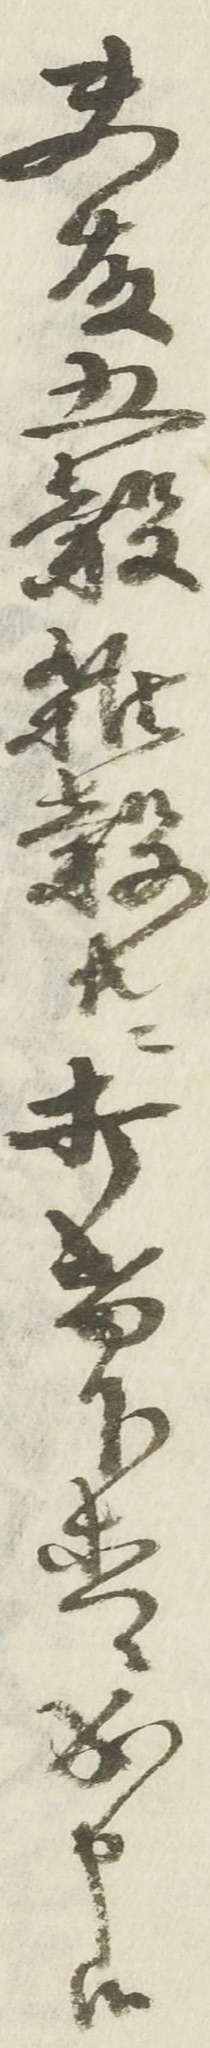夫故五穀雑穀共ニ打替下直ニ成申候
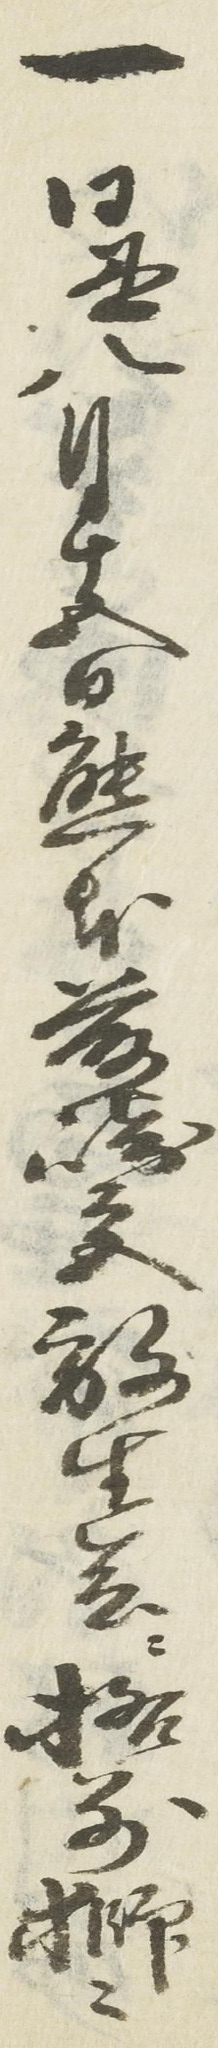一同丑八月十五日熊本藤崎宮放生念ニ格別獅々
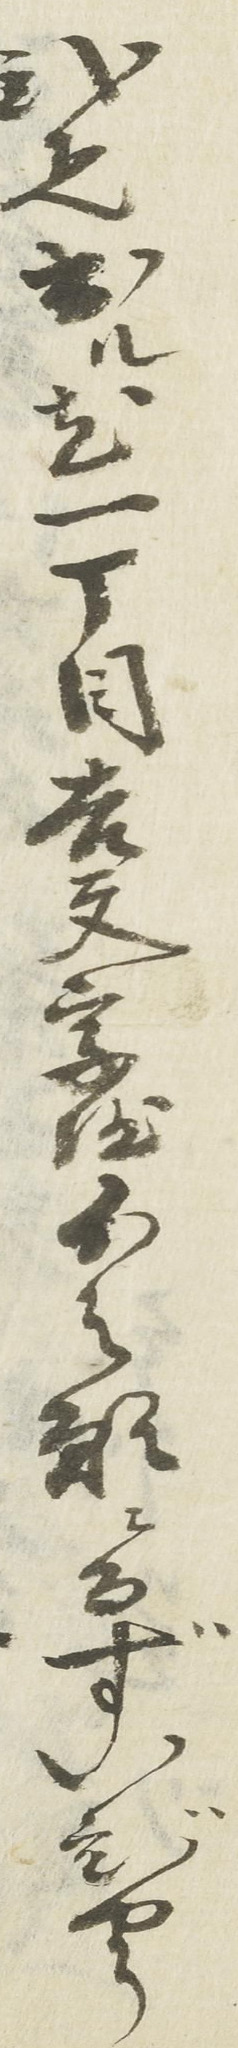弐疋出ル尤一丁目吉文字屋ゟ之願ニ而ずいびゃう
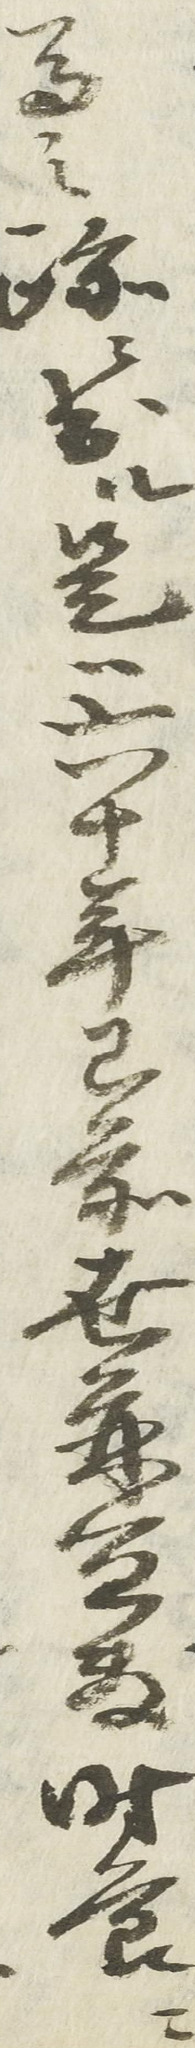当之跡ニ出ル是は六十年已前世并宜敷時節ニ
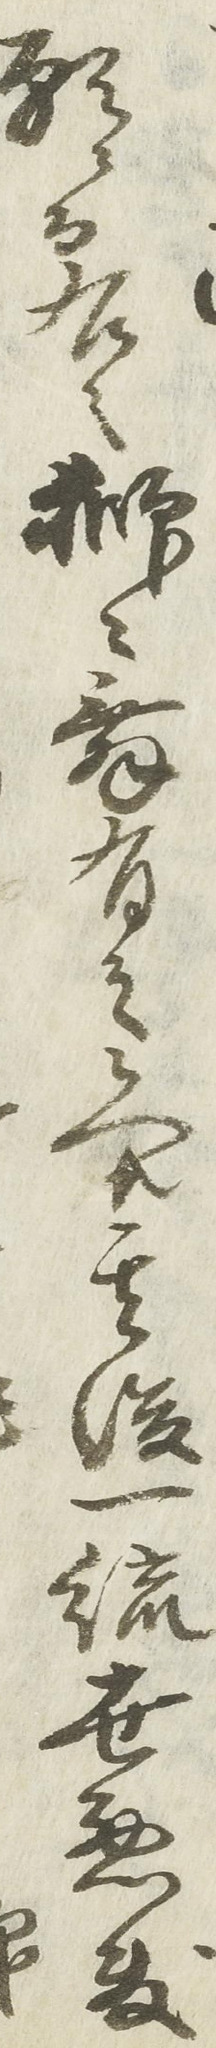願ニ而有之獅子舞有之候へ共其後一統世悪敷
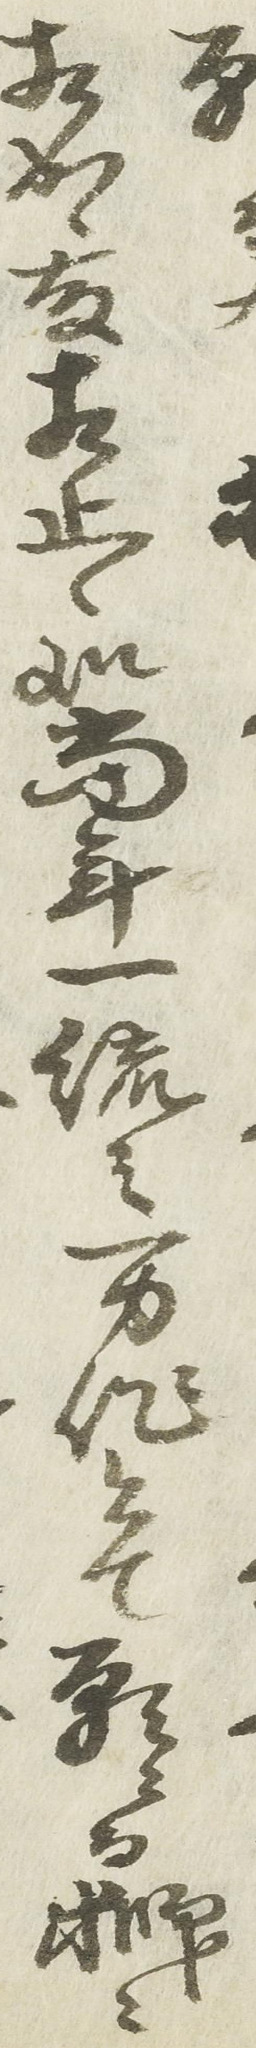相成候故相止候処当年一統之万作とて願ニ而獅々
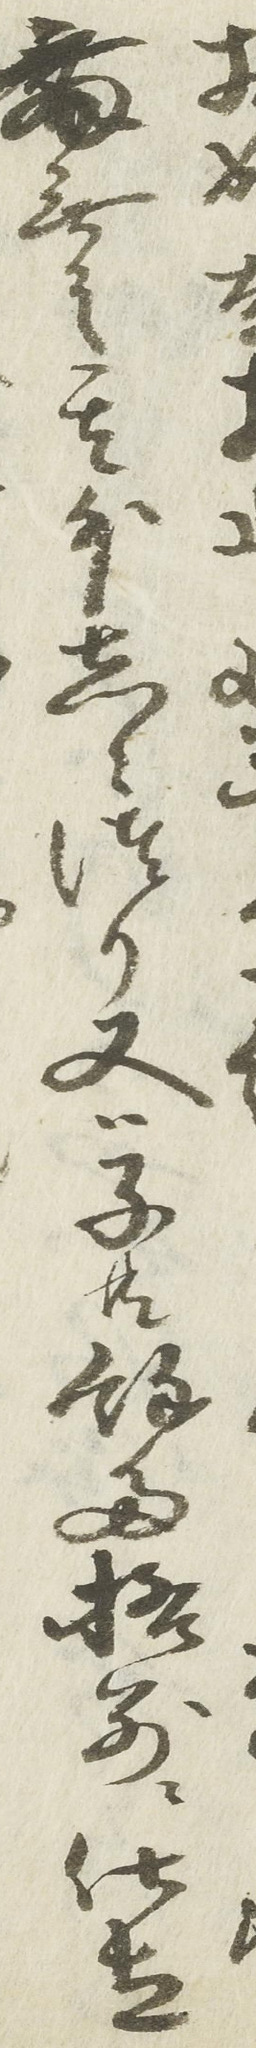舞無之其外し々つくり又は子共餘多格別ニ仕立
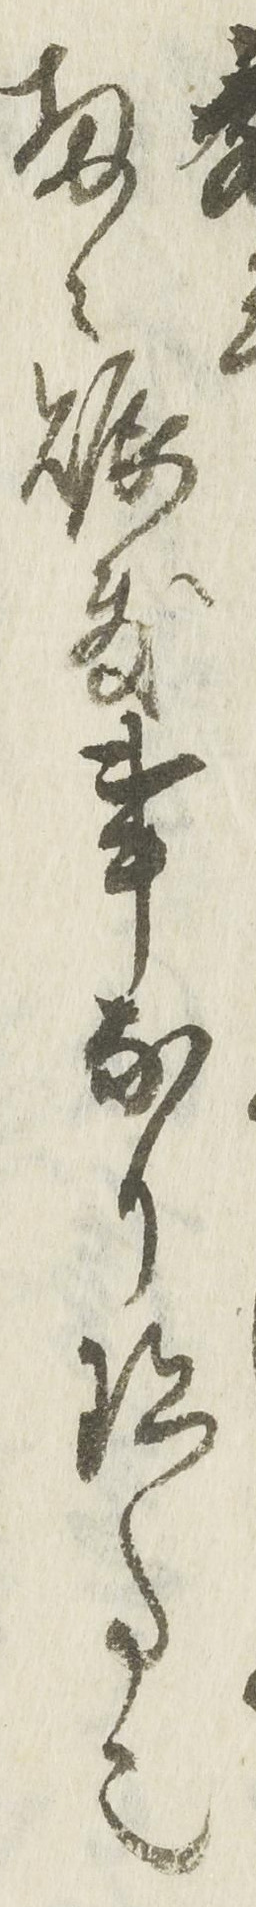扨々賑敷事なり珍事也
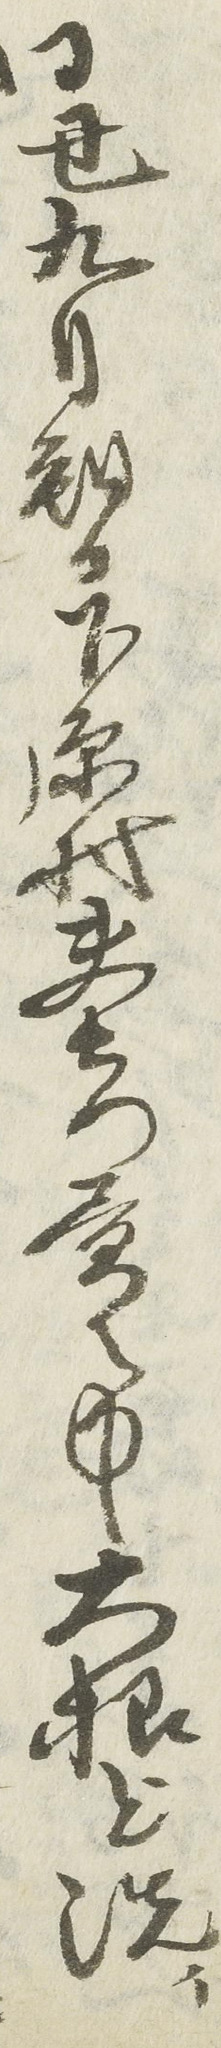一同丑九月朔日下原村夫右衛門昼之中大根を洗イ
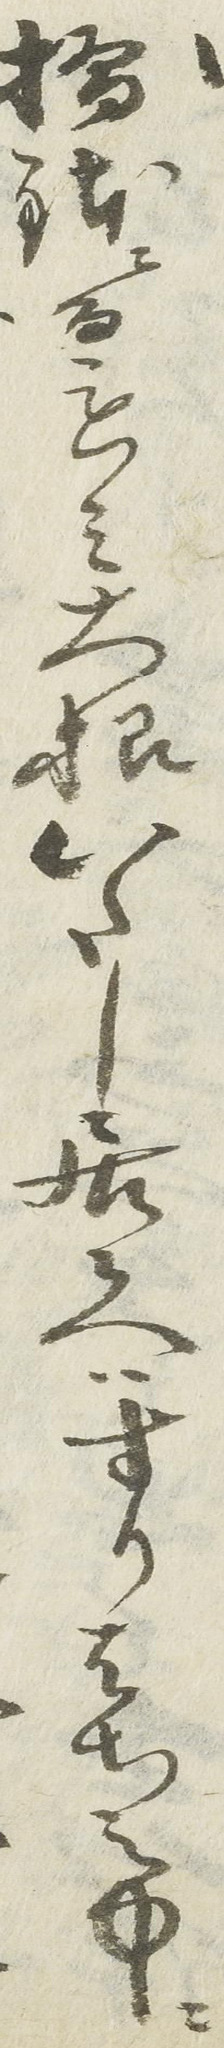摺鉢ニ而もみ大根いたし居候へはすりはちの中ニ
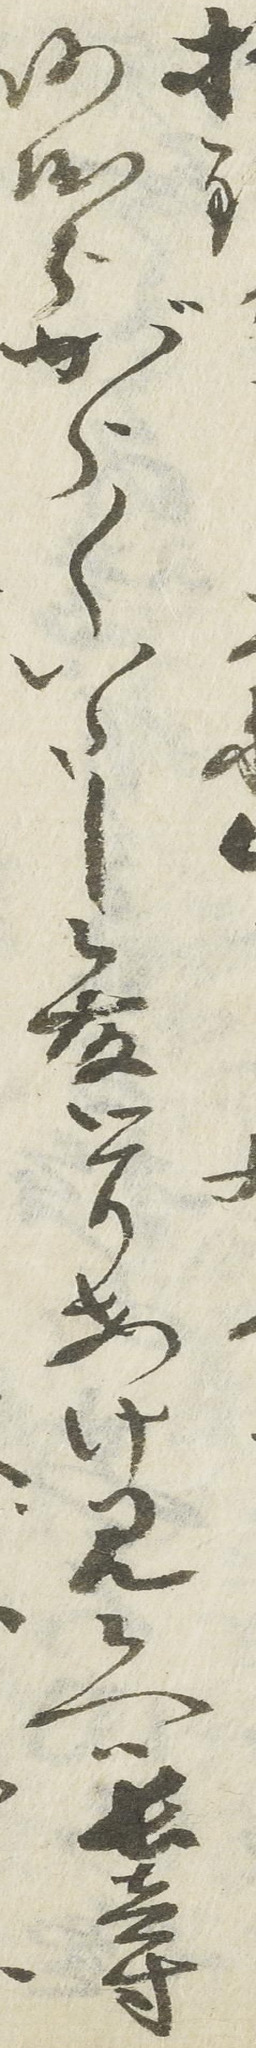何やらがら〳〵いたし候故とりあけ見候へは長壱寸
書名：後見笑
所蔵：東京大学地震研究所図書室 Earthquake Research Institute Library, The University of Tokyo, JAPAN
